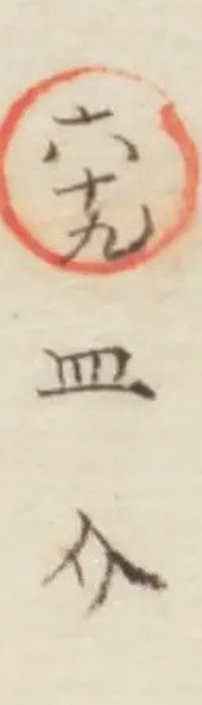六十九皿介
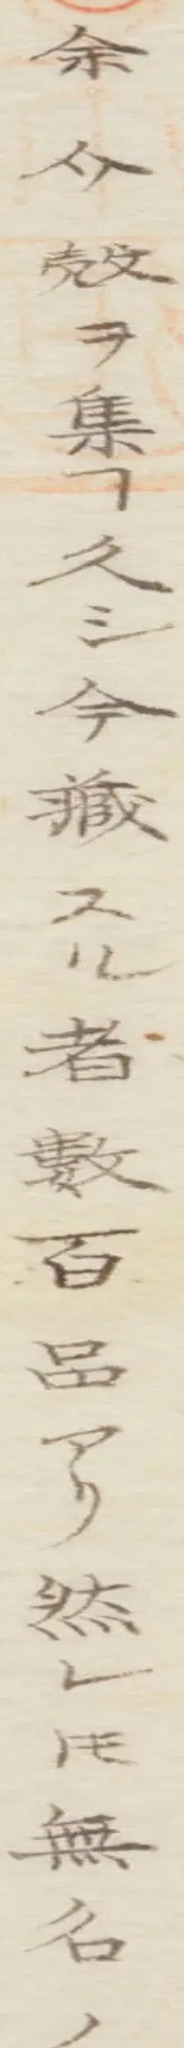○余介殻ヲ集コト久シ今臧スル者數百品アリ然レドモ無名ノ
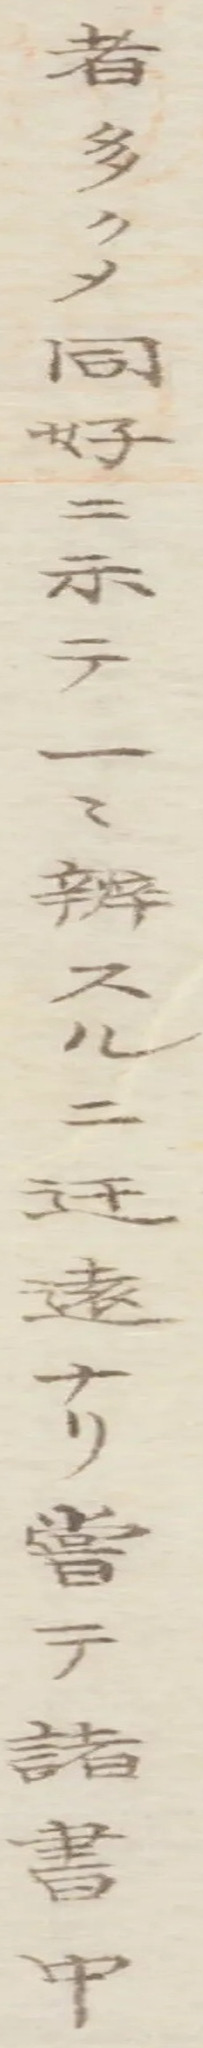者多クノ同好ニ示テ一ゝ辨スルニ迂遠ナリ嘗テ諸書中
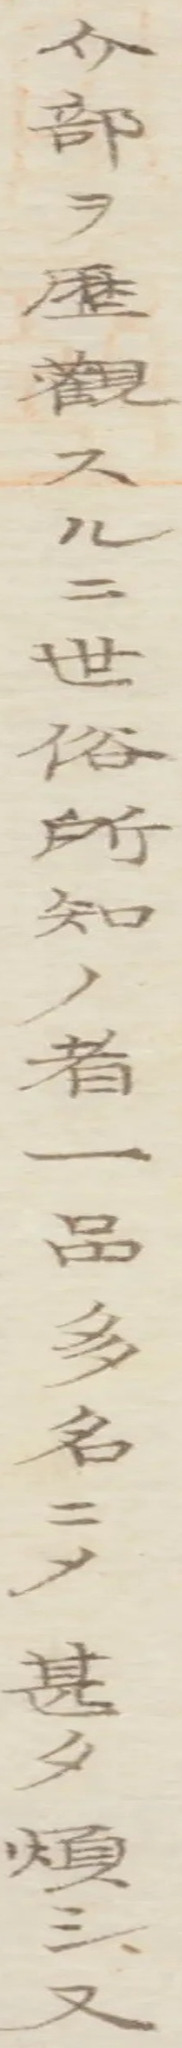介部ヲ歴観スルニ世俗所知ノ者一品多名ニシテ甚タ煩シ、又
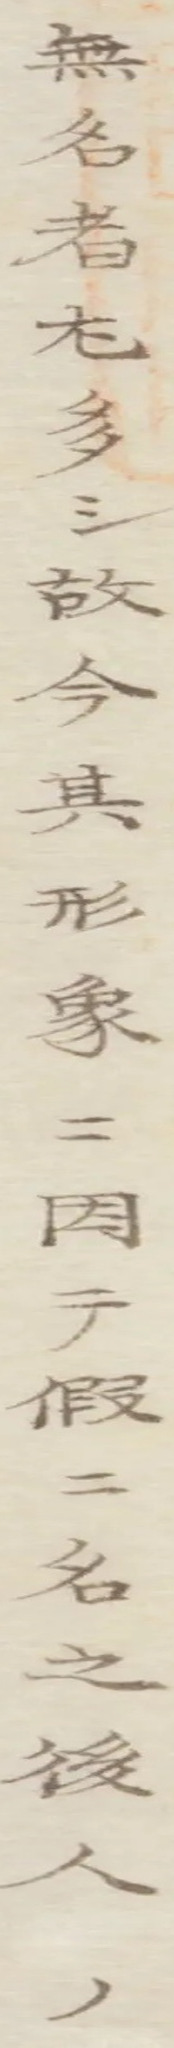無名者尤多シ故今其形象ニ因テ假ニ名之後人ノ
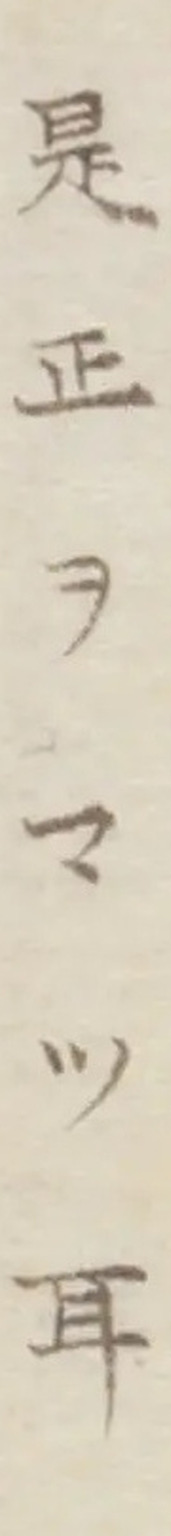是正ヲマツ耳
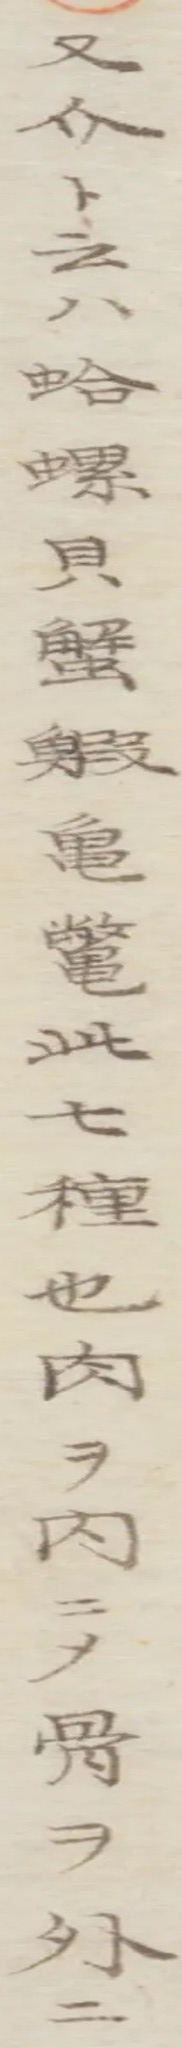○又介トイフハ蛤螺貝蟹鰕亀鼈此七種也肉ヲ肉ニシテ骨ヲ外ニ
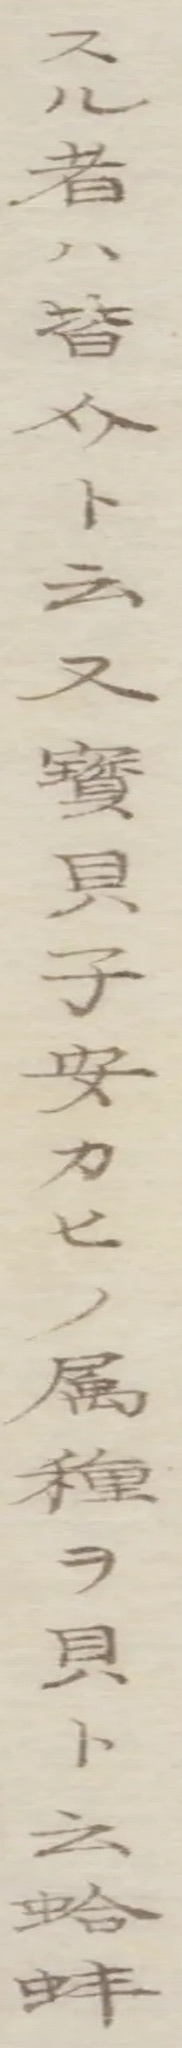スル者ハ皆介トイフ又寳貝子安カヒノ属種ヲ貝トイフ蛤蚌
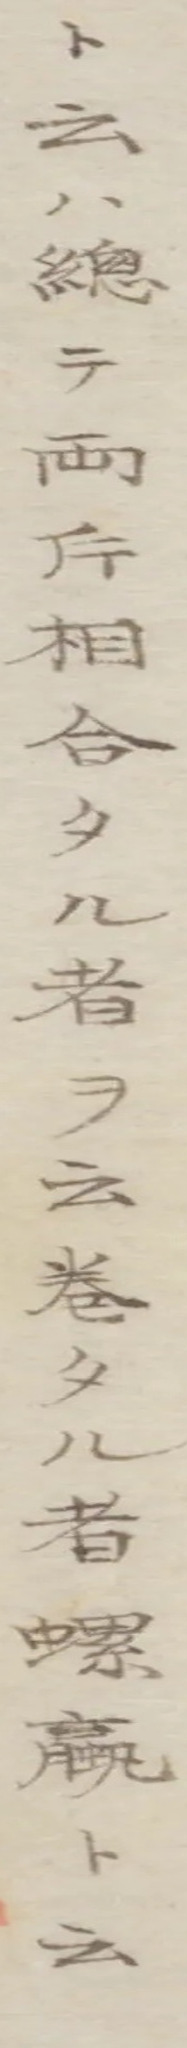トイフハ総テ両斤相合タル者ヲイフ巻タル者螺蠃トイフ
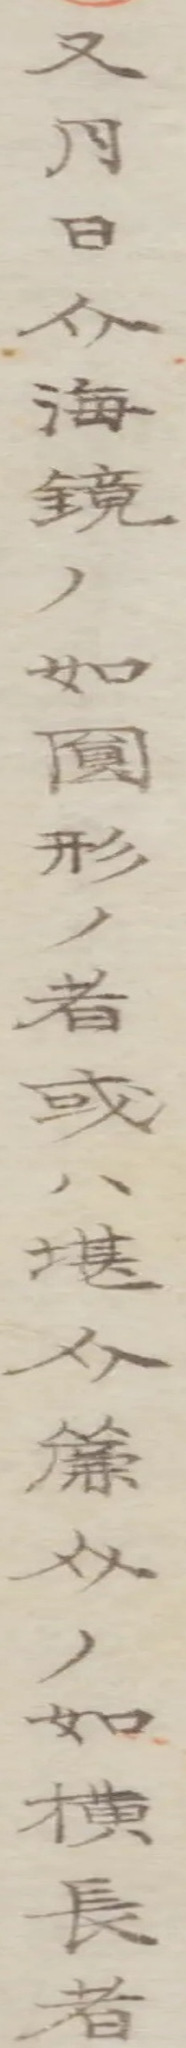○又月日介海鏡ノ如炎圓形ノ者或ハ堪介簾介ノ如横長者
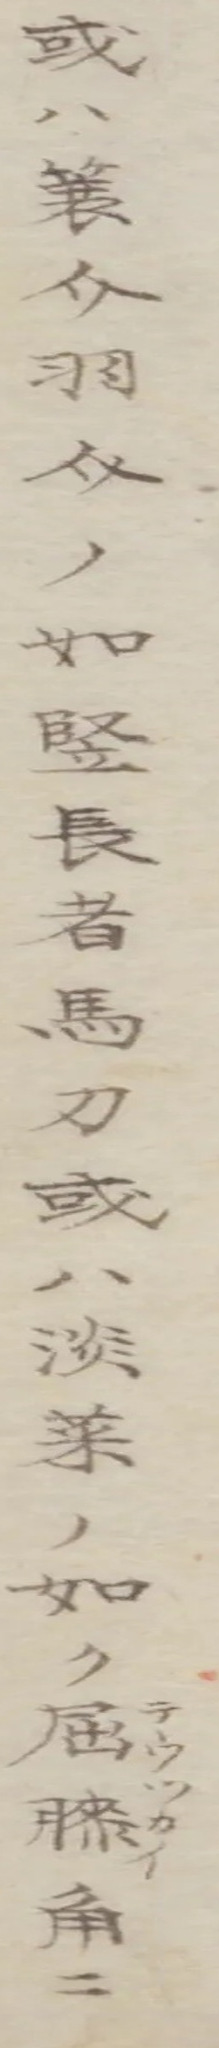或ハ簔介羽介ノ如竪長者馬刀或ハ淡菜ノ如ク屈膝角ニ

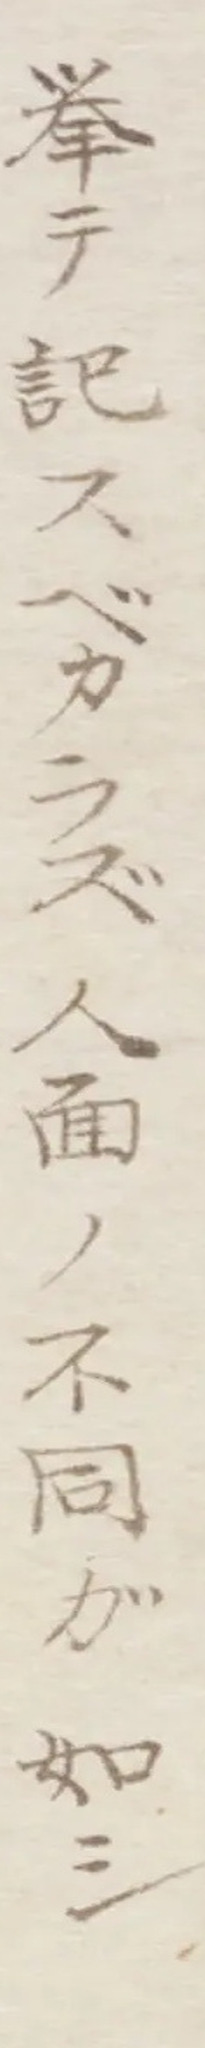挙テ記スベカラズ人面ノ不同ガ如シ
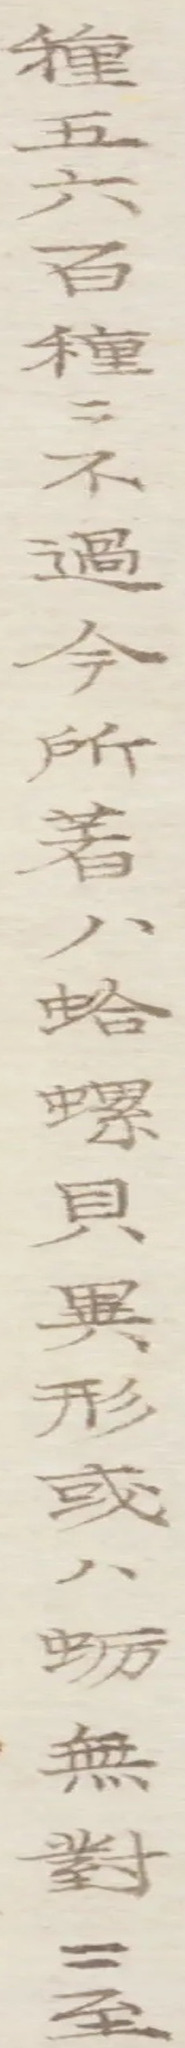種五六百種ニ不過今所著ハ蛤螺貝異形或ハ蛎無對ニ至
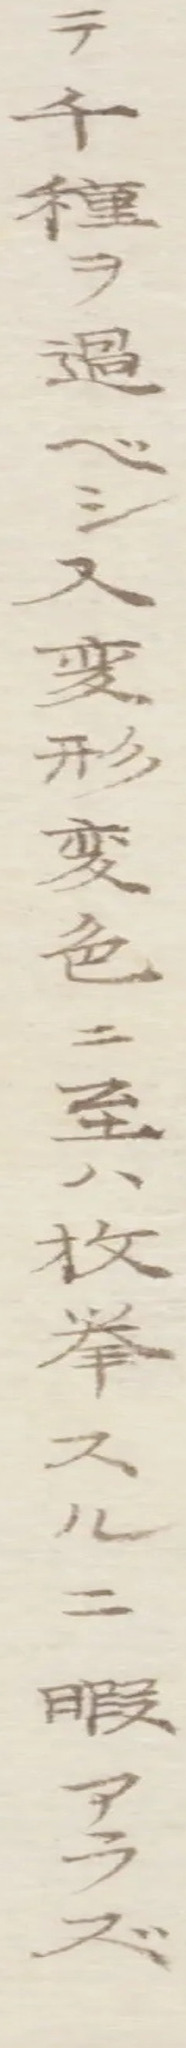テ千種ヲ過ベシ又変形変色ニ至ハ枚挙スルニ暇アラズ
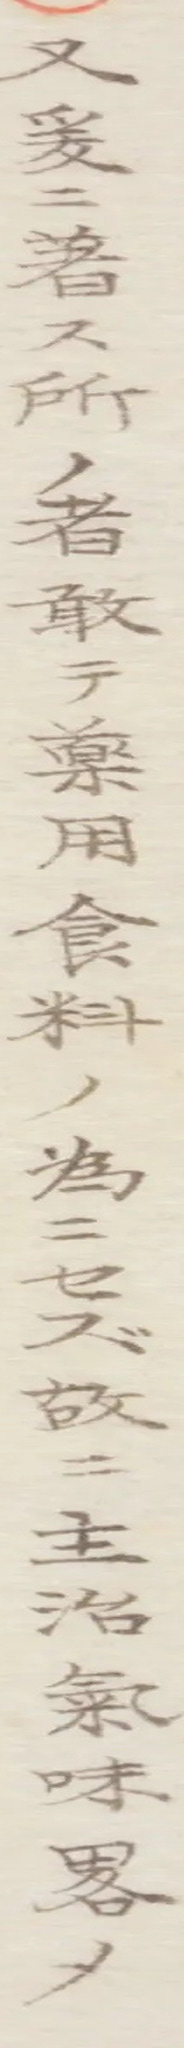○又爰ニ著ス所ノ者敢テ薬用食料ノ為ニセズ故ニ主治気味略シテ
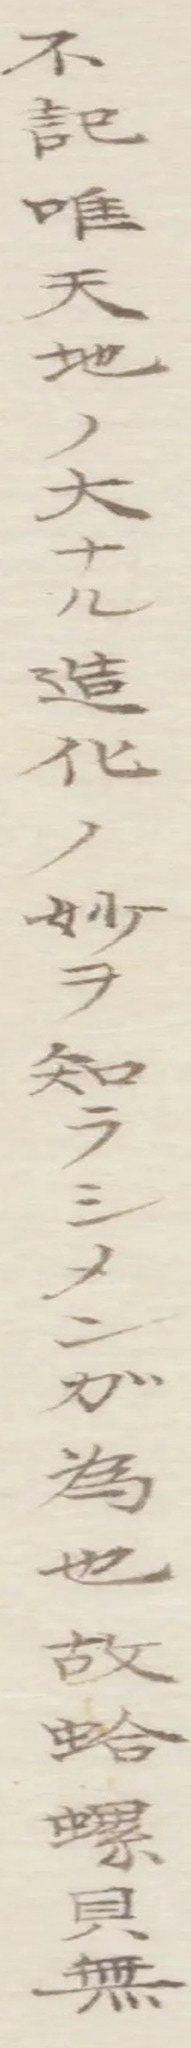不記唯天地ノ大ナル造化ノ妙ヲ知ラシメンガ為也故蛤螺貝無
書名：目八譜. 第１巻
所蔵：国立国会図書館 National Diet Library, JAPAN
